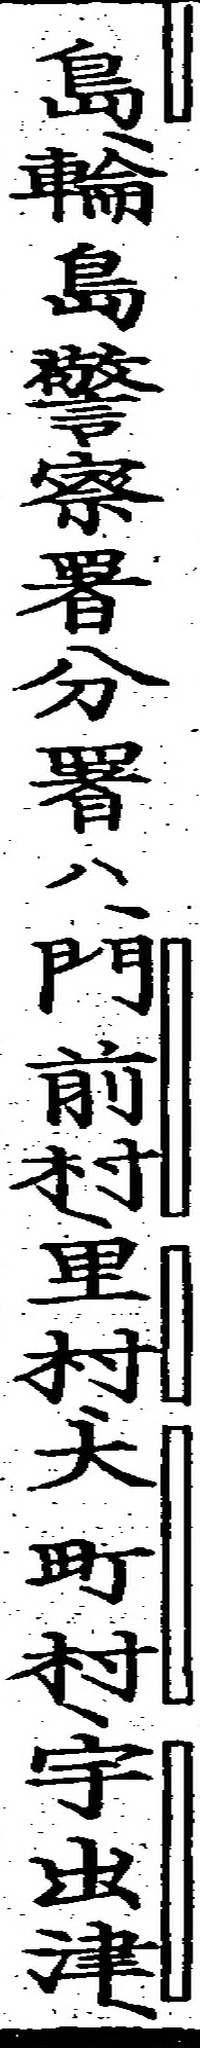島、輪島警察署分署ハ、門前村・里村・大町村・宇出津、
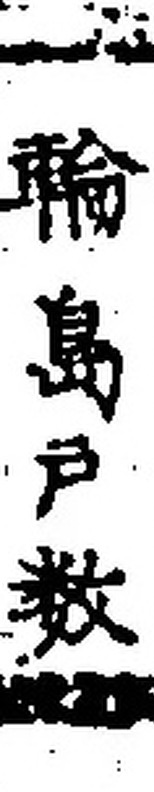輪島戸数
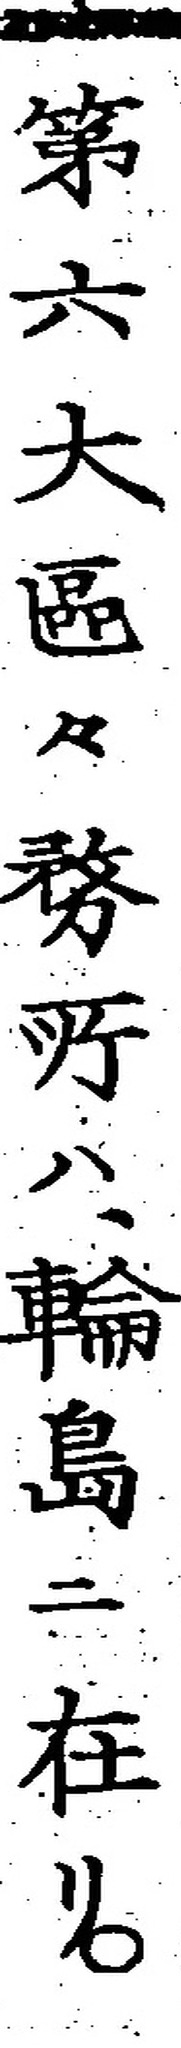第六大区々務所ハ、輪島ニ在リ。
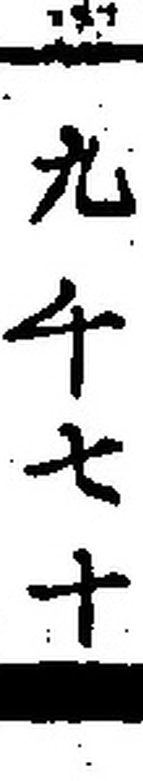九千七十
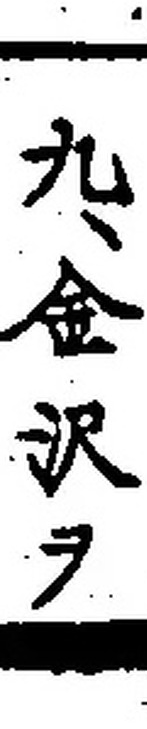九、金沢ヲ
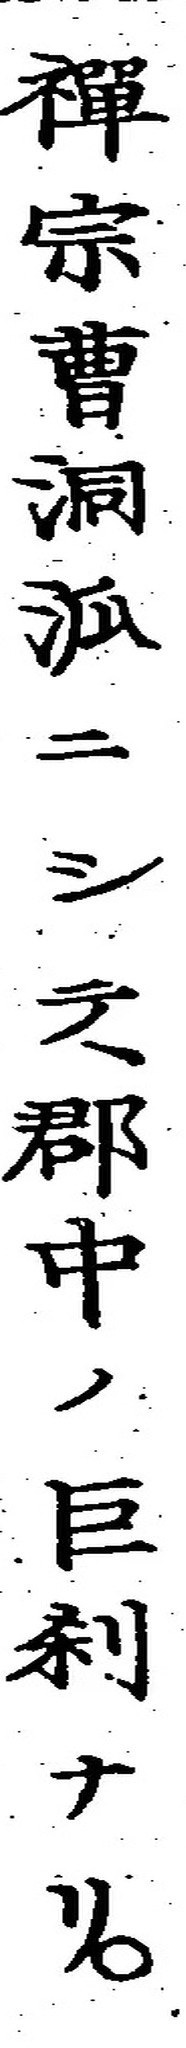禅宗曹洞派ニシテ、郡中ノ巨刹ナリ。
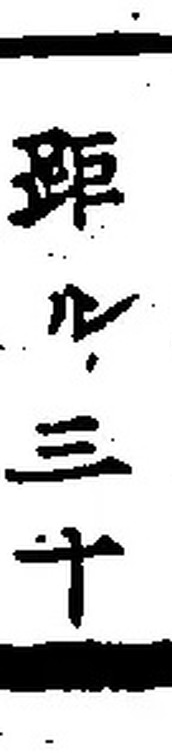距ル三十
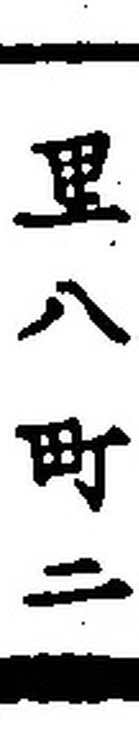里八町二

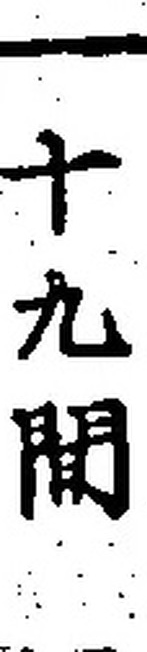十九間
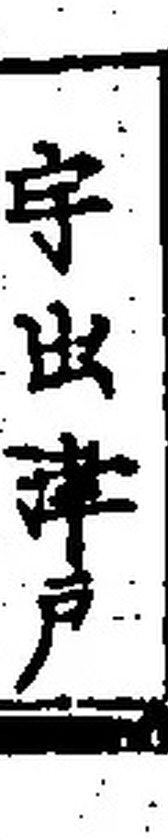宇出津戸
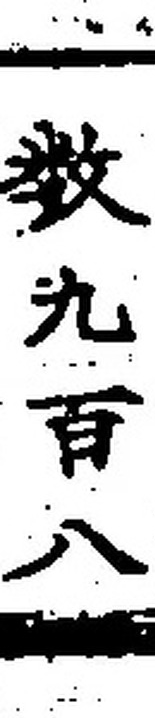数九百八
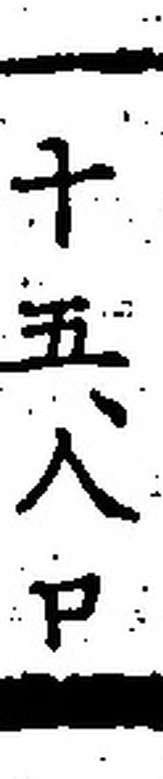十五、人口
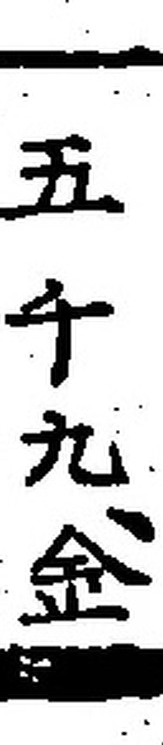五千九、金
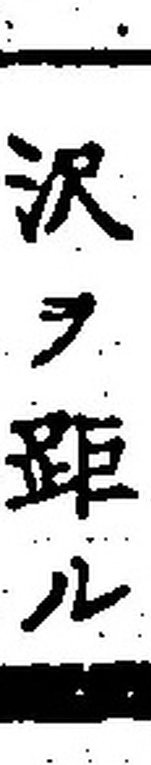沢ヲ距ル
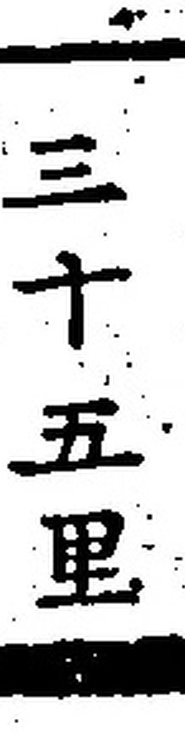三十五里
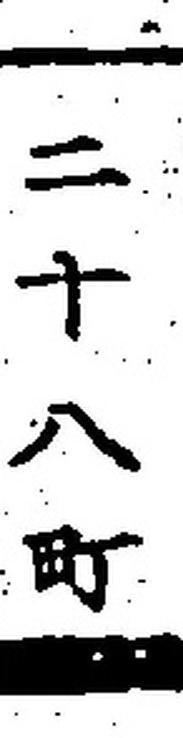二十八町
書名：能登地誌略
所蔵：国立国会図書館 National Diet Library, JAPAN
